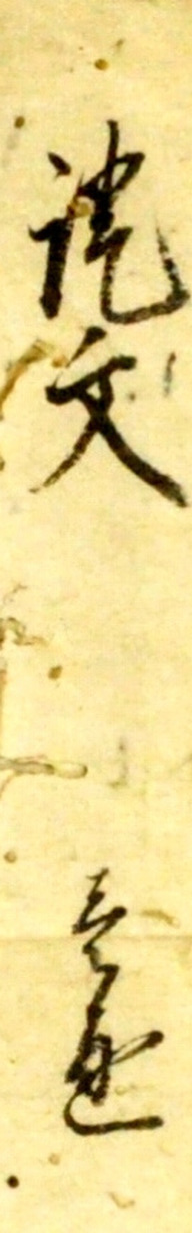證文壱通

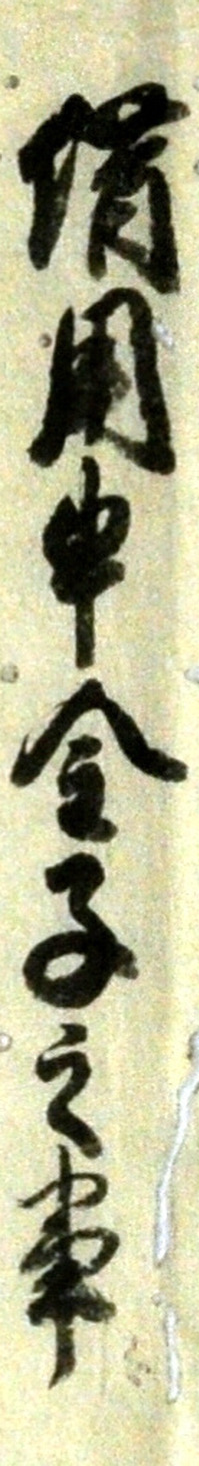借用申金子之事
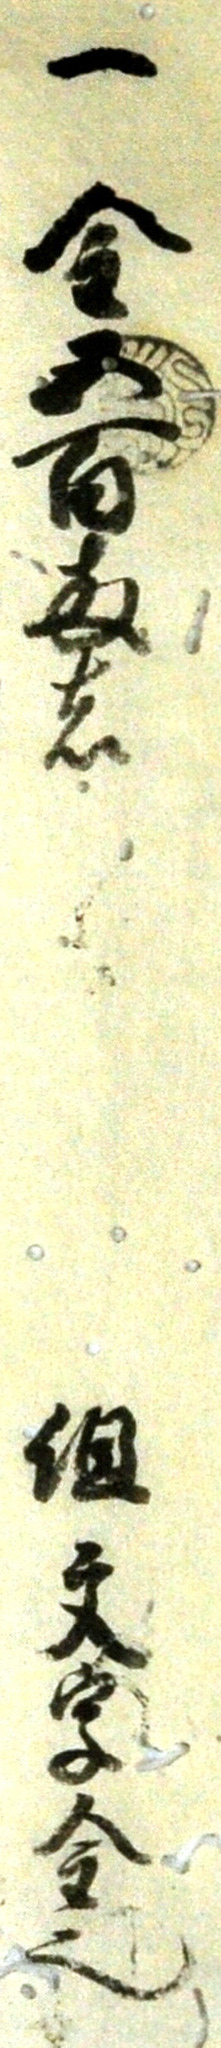一金五百両は但文字金也
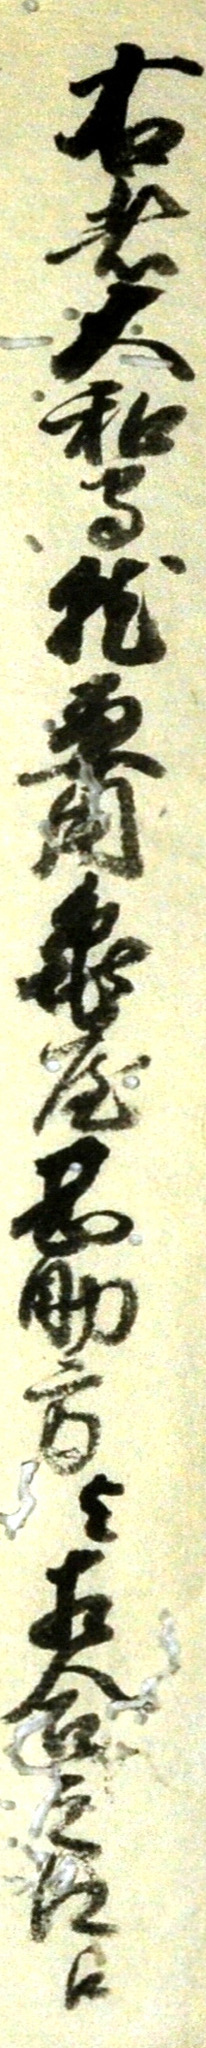右は大和守就要用亀屋甚助方と相合之口え
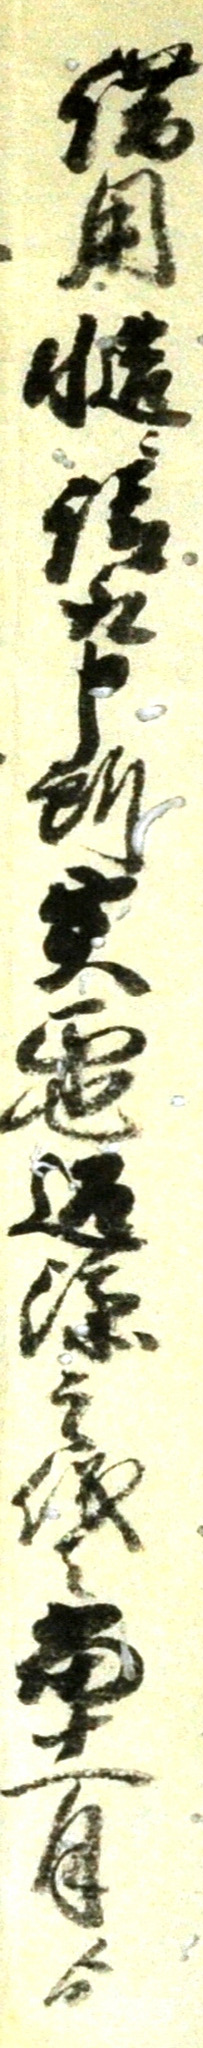借用慥に請取申所実正也返済之儀は当十一月ゟ
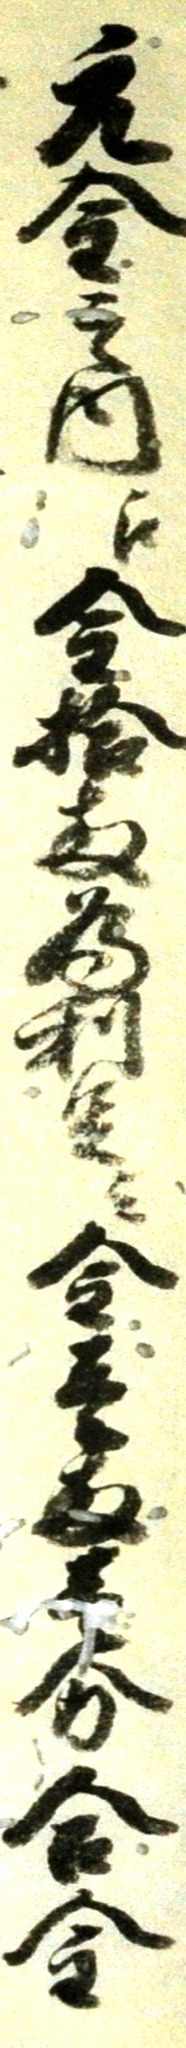元金之内え金拾両為利足と金壱両壱分合金
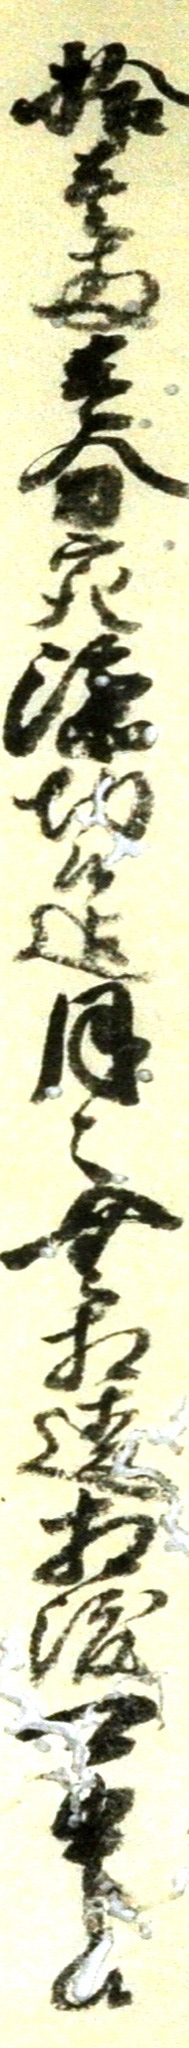拾壱両壱分宛済切候迄月々無相違相渡可申候
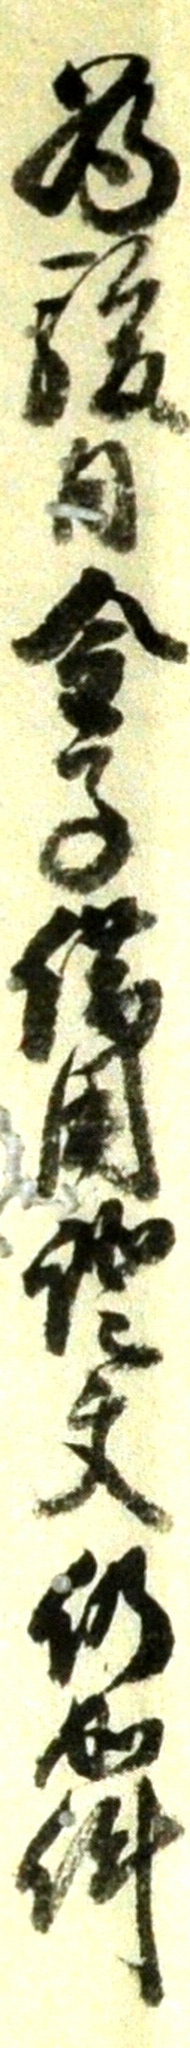為後日金子借用証文仍如件
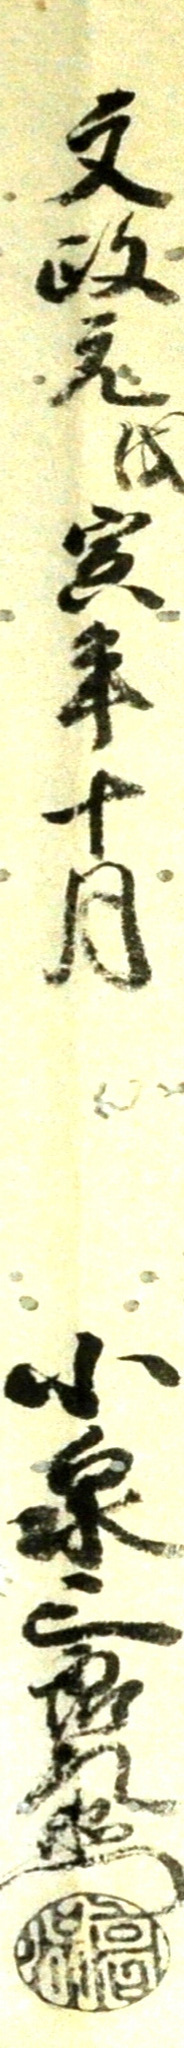文政元戊寅年十月小泉三郎左衛門㊞
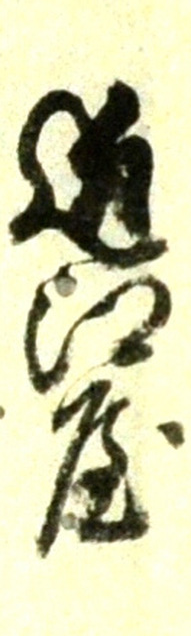近江屋
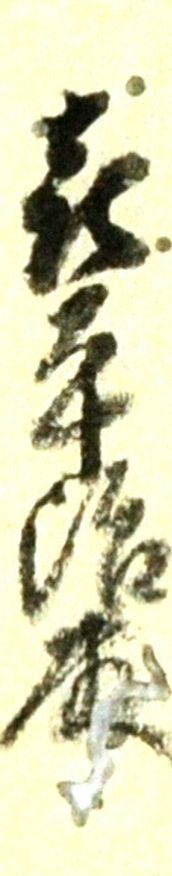喜平治殿
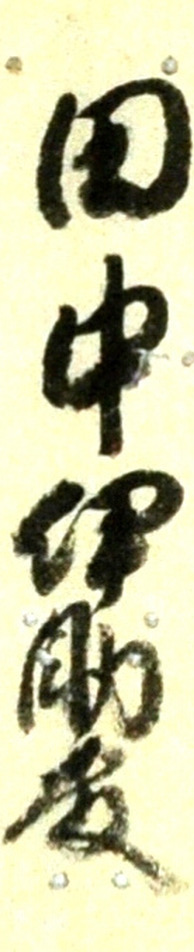田中伊助殿
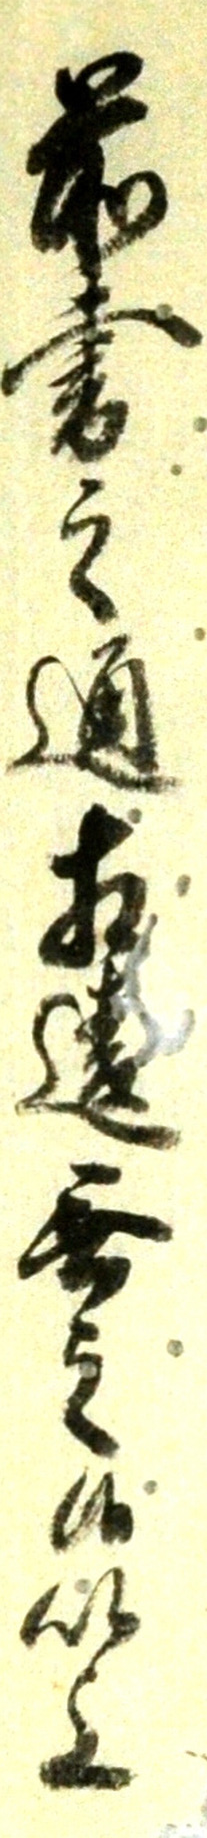前書之通相違無之候以上
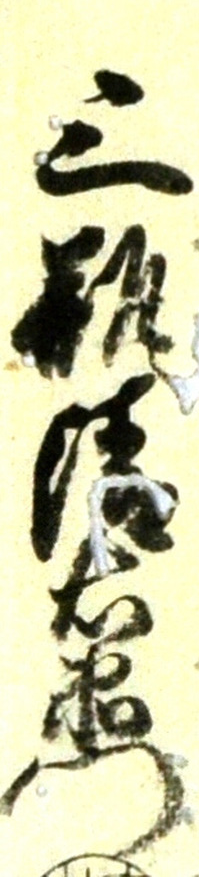三瓶清右衛門㊞
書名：借用申金子之事
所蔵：伊那市立高遠町図書館・合同会社AMANE
